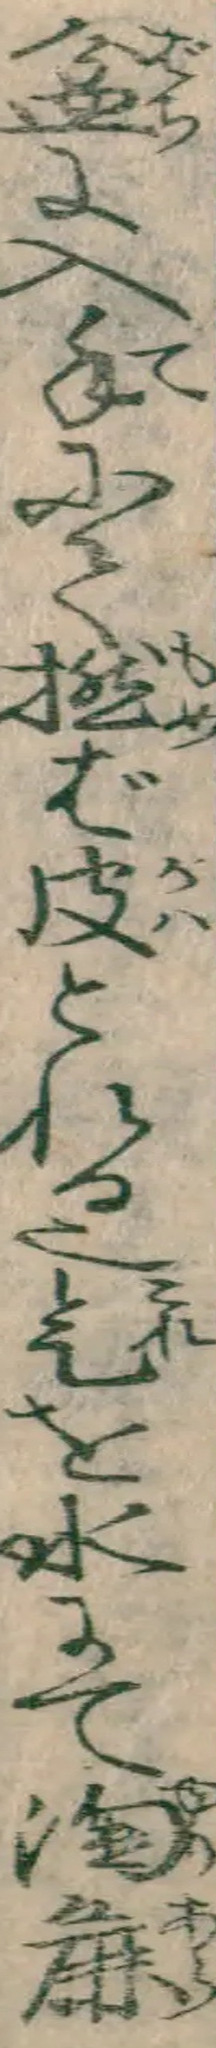盆に入手にて撚ば皮とれる也是を水にて淘麁
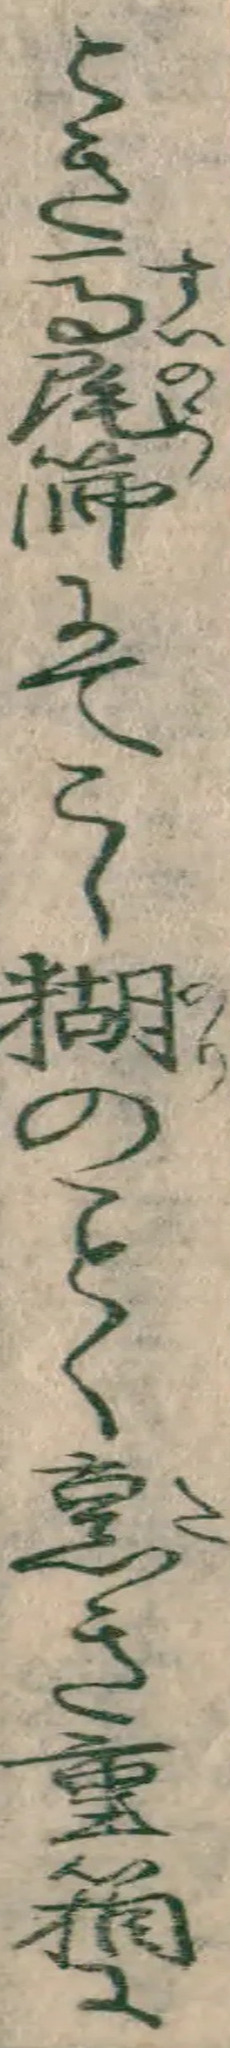とき馬尾篩にてこし糊のことく烹き重箱に
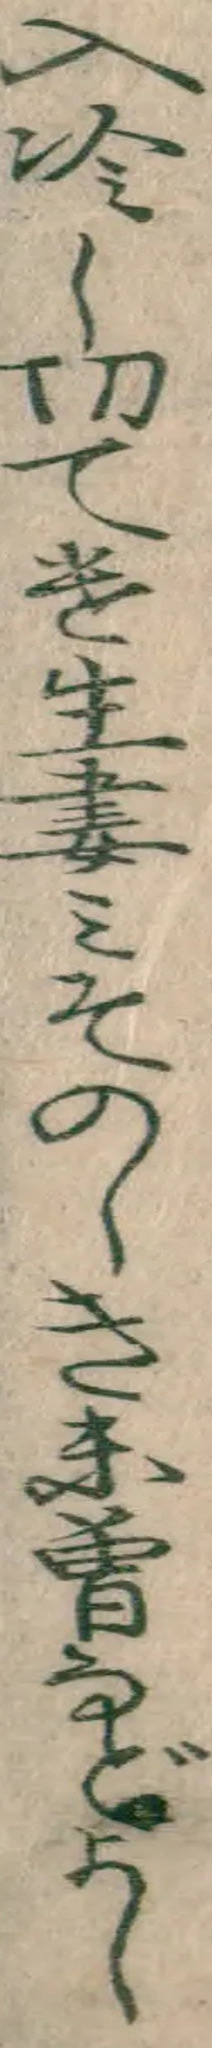入冷し切て遣生姜みそのしき味曽などよし
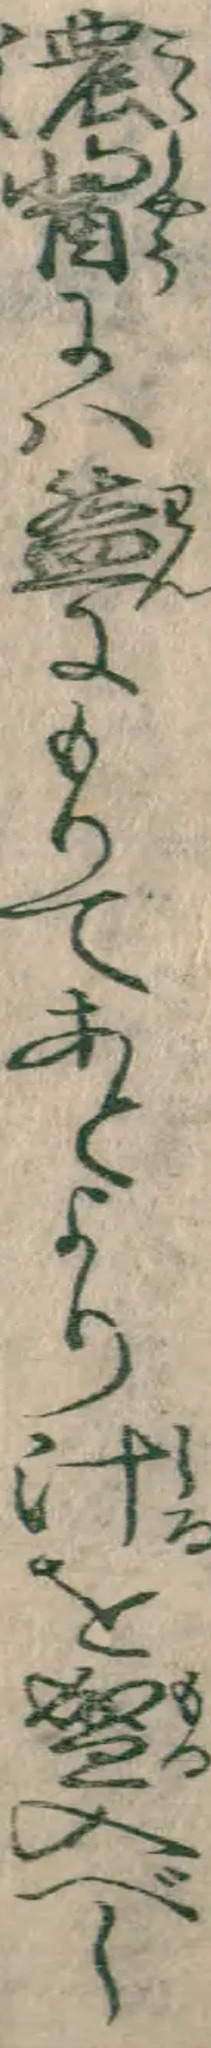濃醤には盌にもりてあとより汁を盛入べし
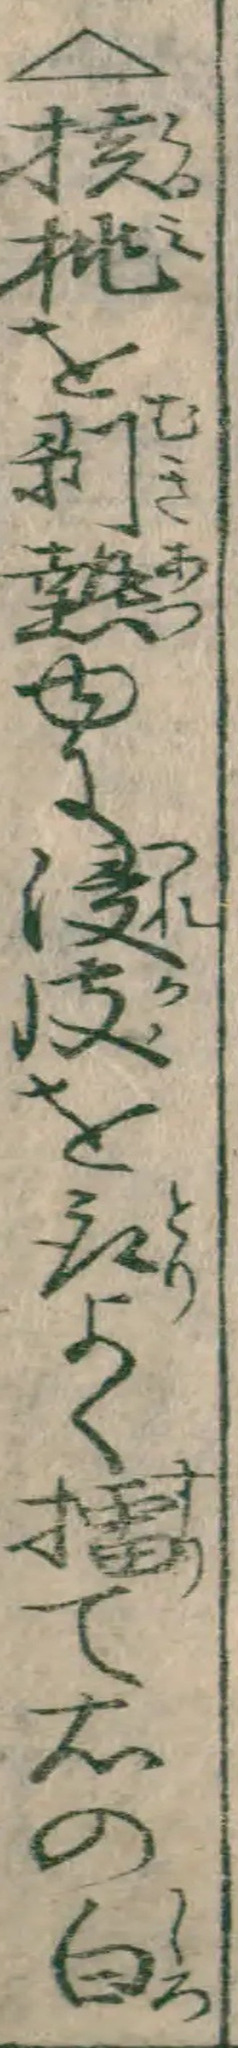△核桃を剥熱ゆに浸皮を取よく擂て右の白
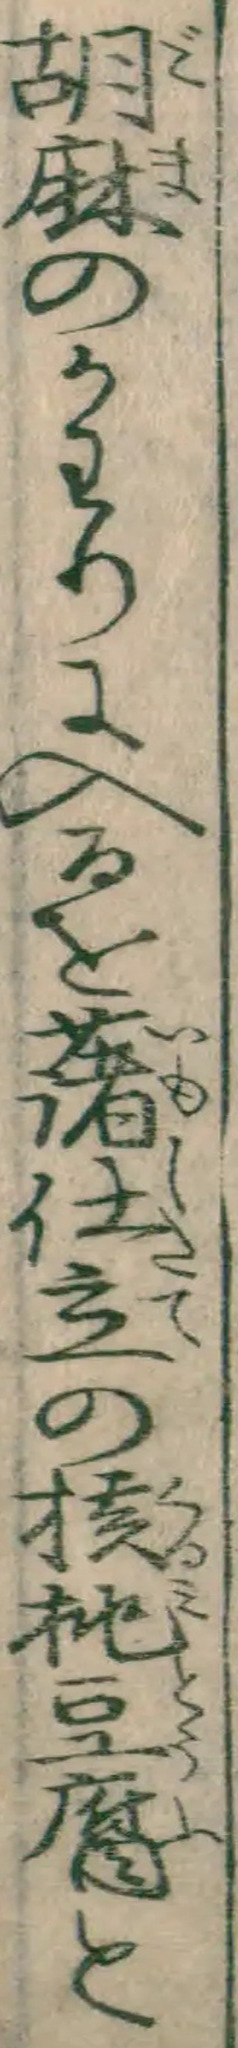胡麻のかわりに入るを藷仕立の核桃豆腐と

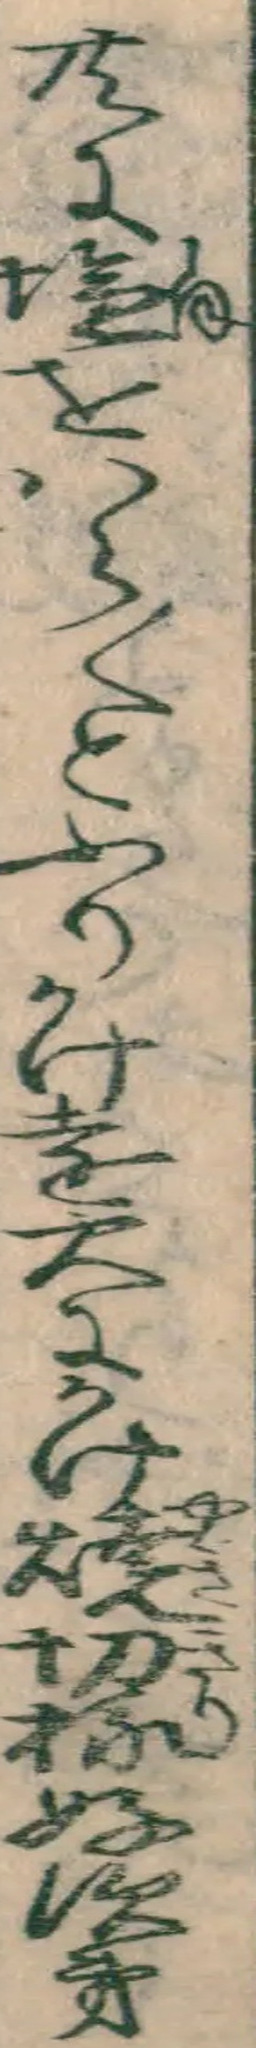共に塩をはら〳〵とふりかけ遠火にかけ焼切様好次第
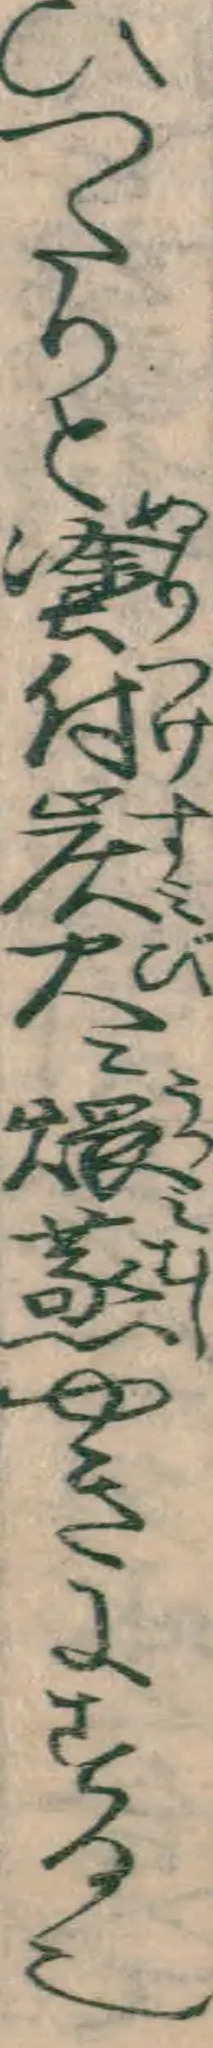ひつたりと塗付炭火に煨蒸やきにする也
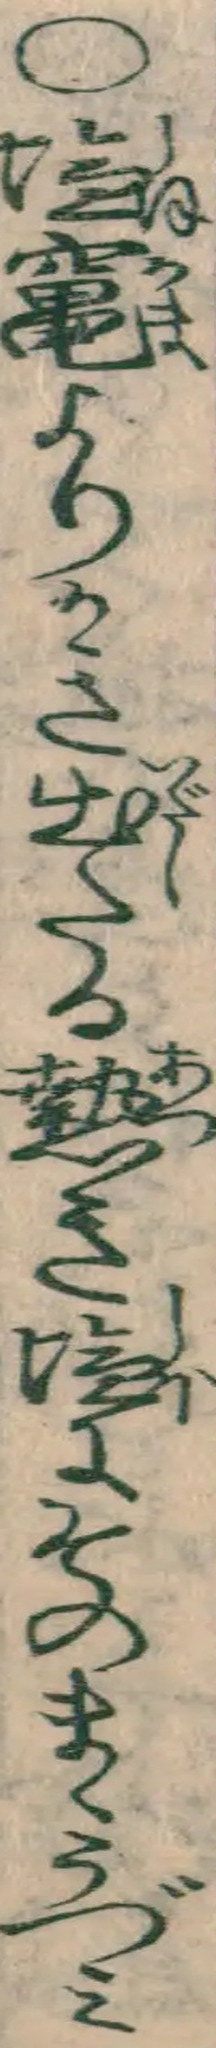○塩竃よりかき出たる熱き塩にそのまゝうづみ
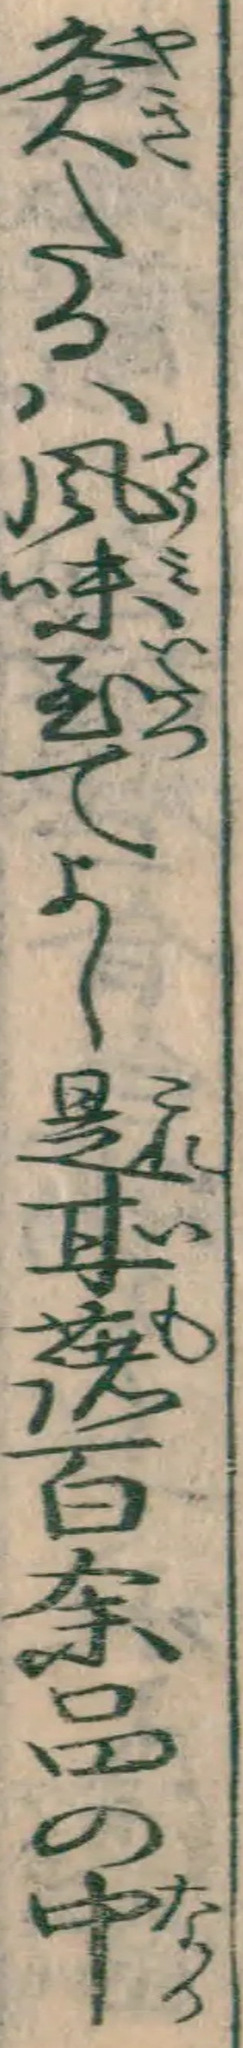灸たるは風味至てよし是甘藷百余品中の中
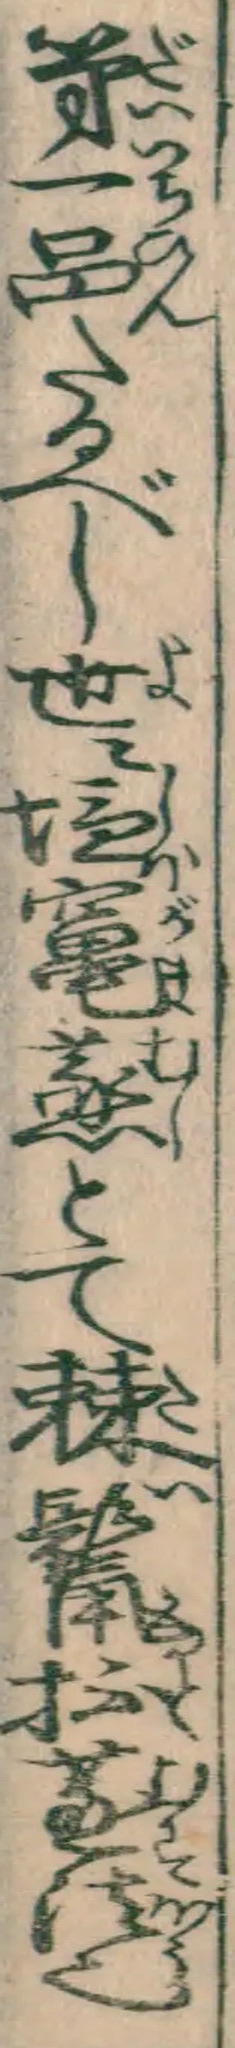第一品たるべし世に塩竃蒸とて棘鬣抔蒸法也
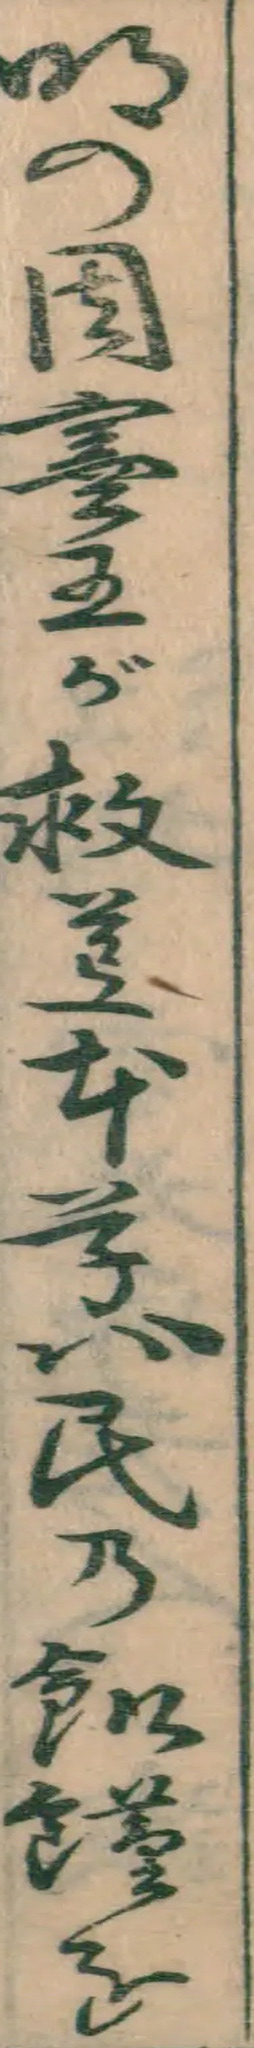明の周寧王が救荒本草は、民の飢饉を
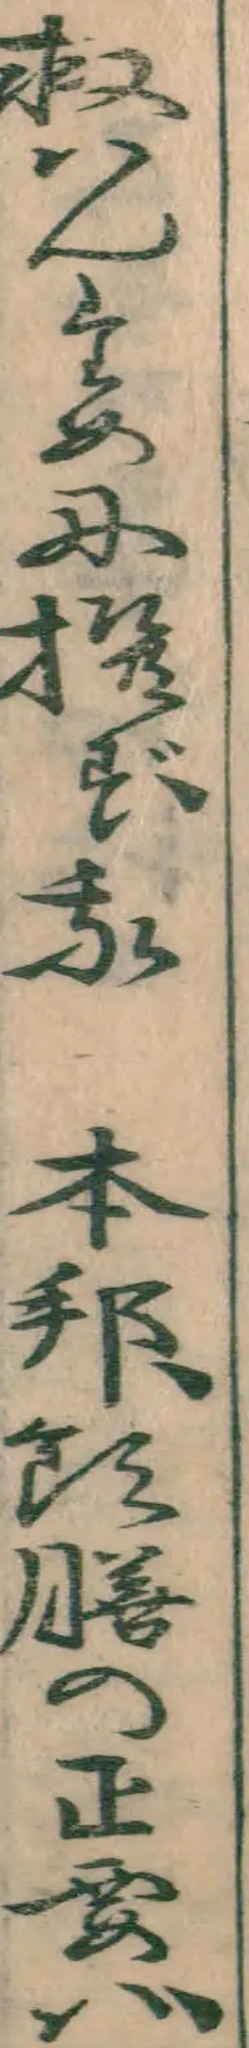救はんために撰ず、我本邦、飲膳の正要は、
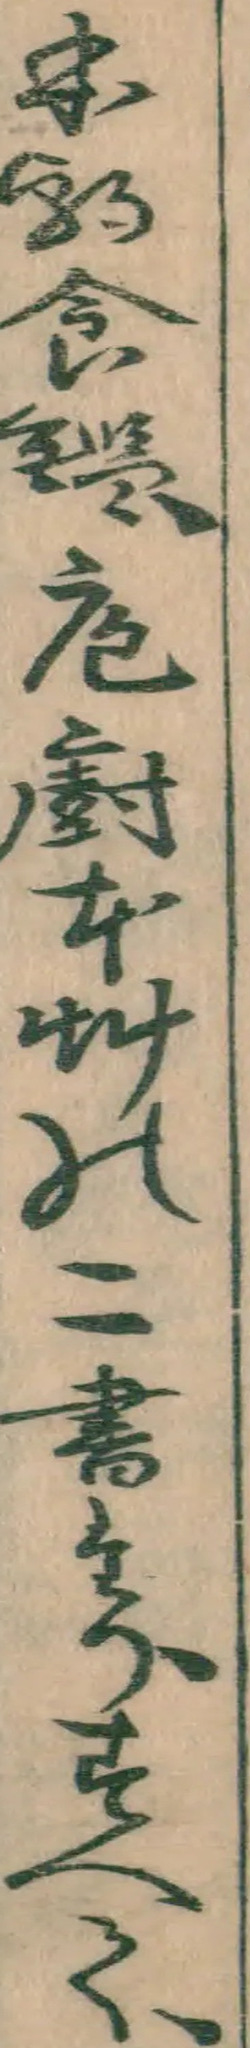本朝食鑑、庖厨本草の二書たり、すへて、
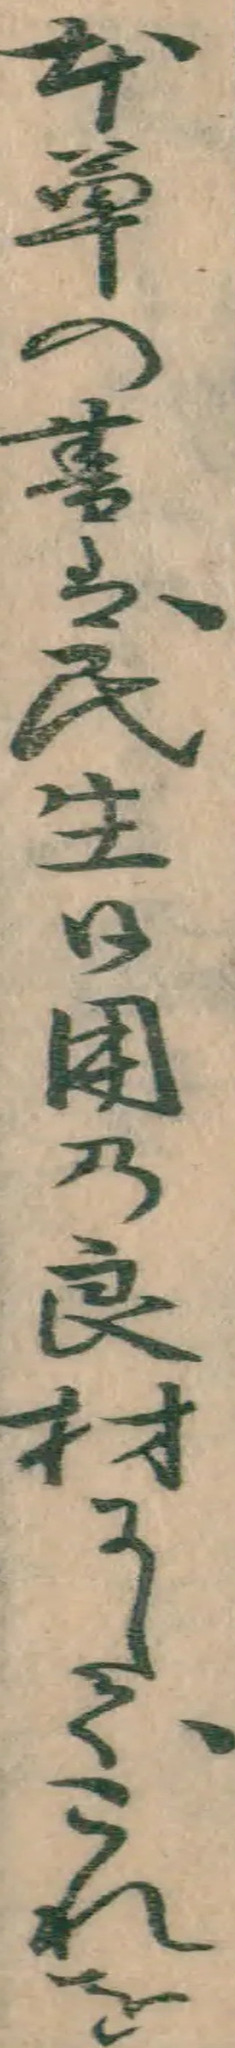本草の書は、民生日用の良材にして、これを
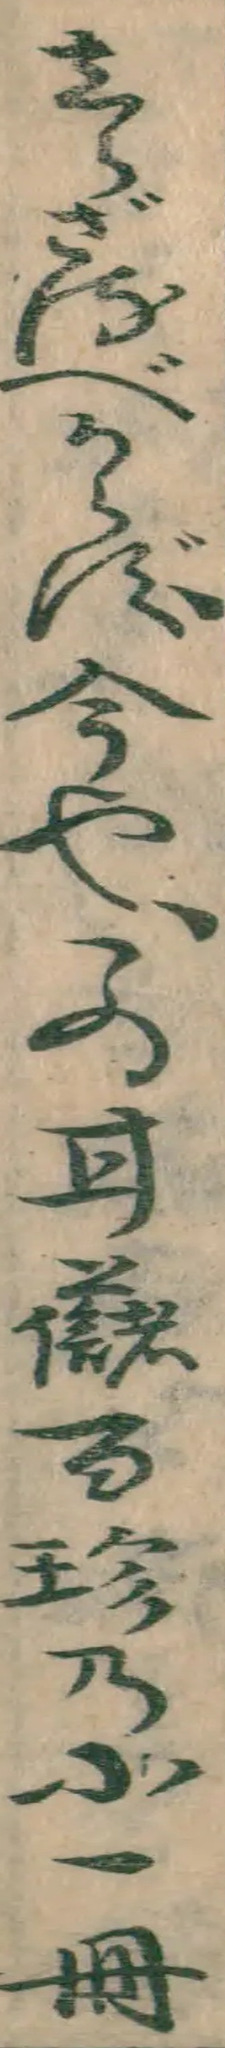しらざるべからず、今や、この甘藷百珍の小一冊
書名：甘藷百珍
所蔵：国立国会図書館 National Diet Library, JAPAN
